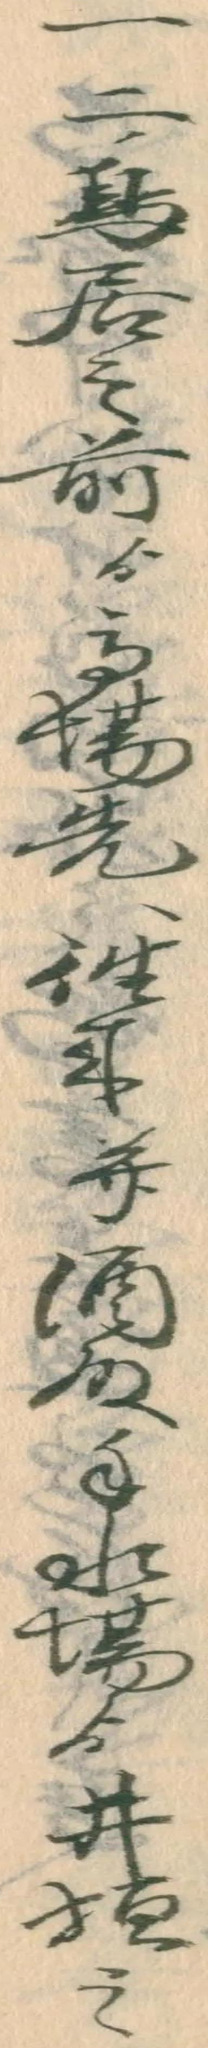一二ノ鳥居之前ゟ馬場先へ往来并酒殿手水場ゟ井垣之
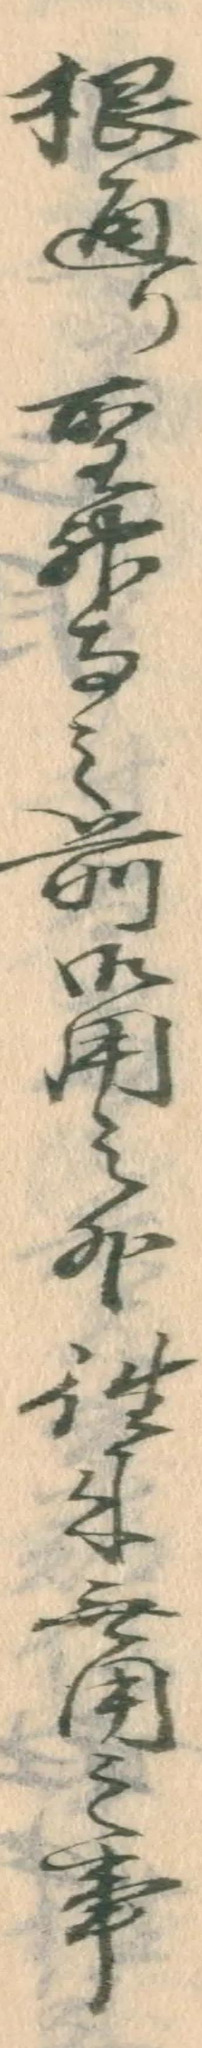根通り聖神寺之前御用之外往来無用之事
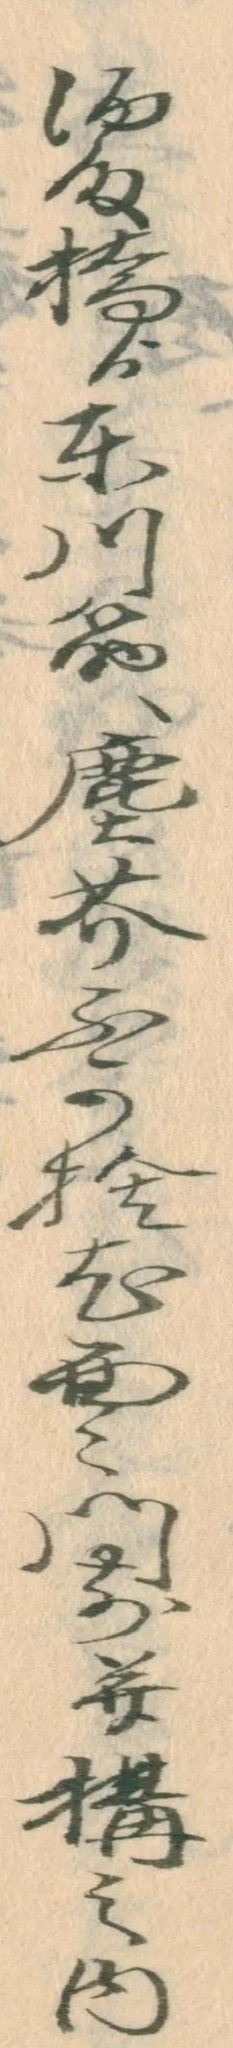一酒殿橋ゟ東川筋へ塵芥不可捨尤面々門前并構之内
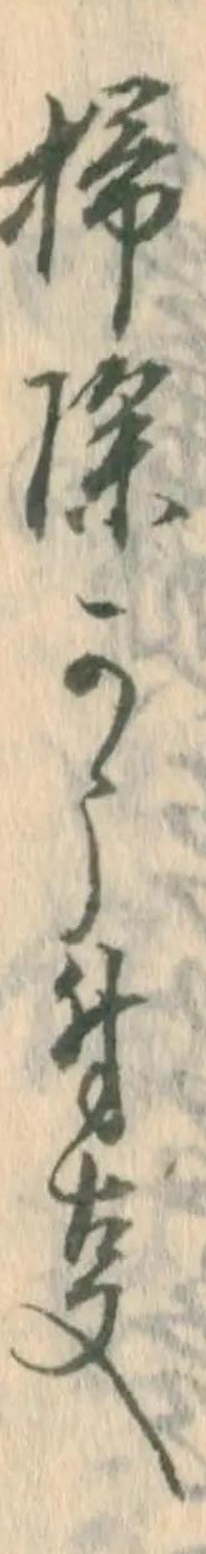掃除可申付事
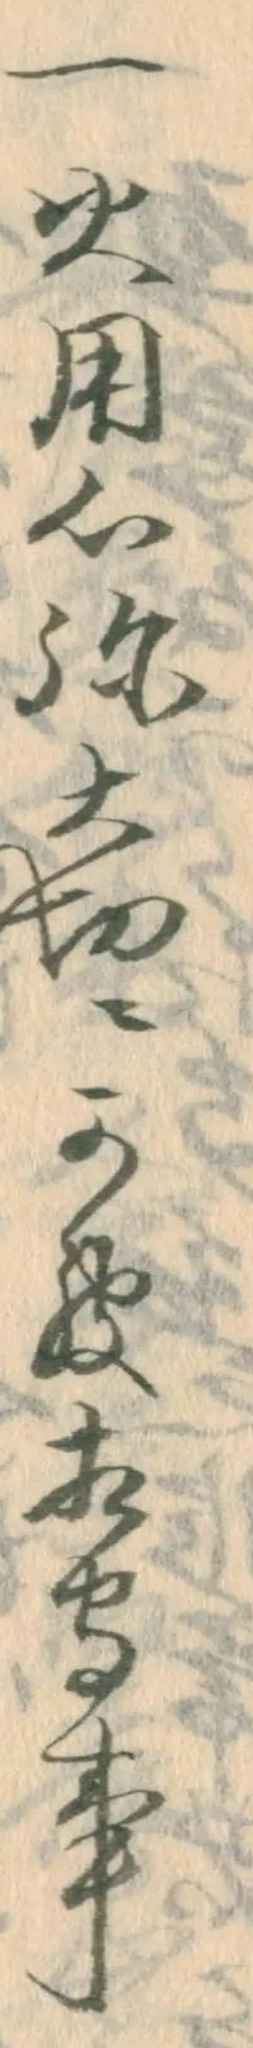一火用心弥大切ニ可被相守事
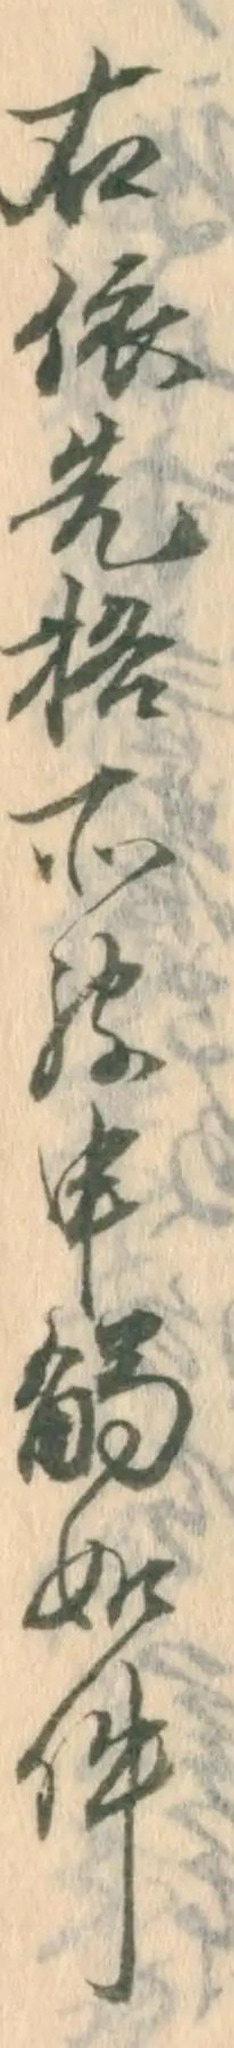右依先格所被申触如件

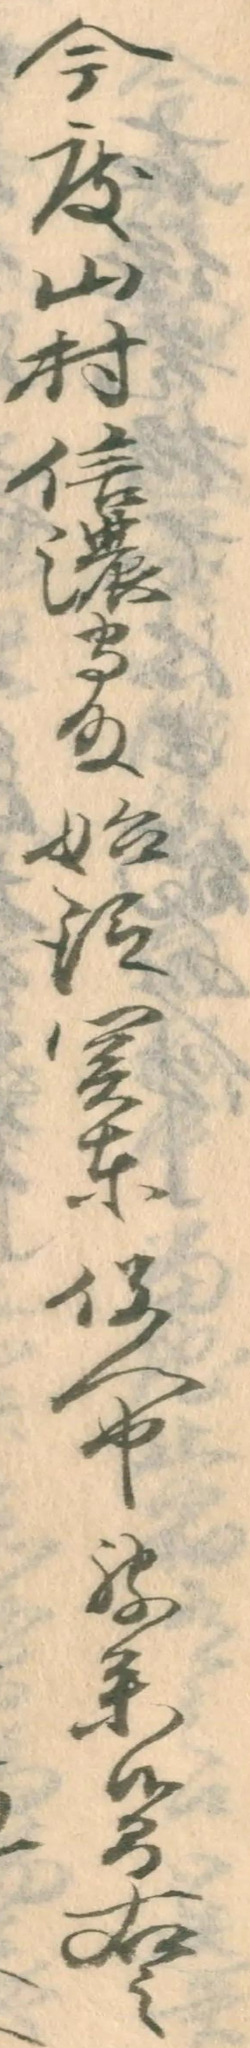今度山村信濃守殿始従関東役人中被参候間右之
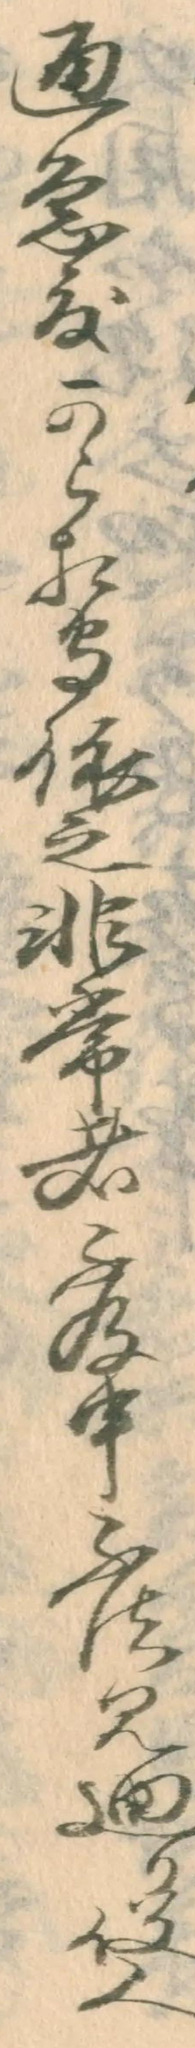通急度可被相守依之非常は不及申不法見廻り役人
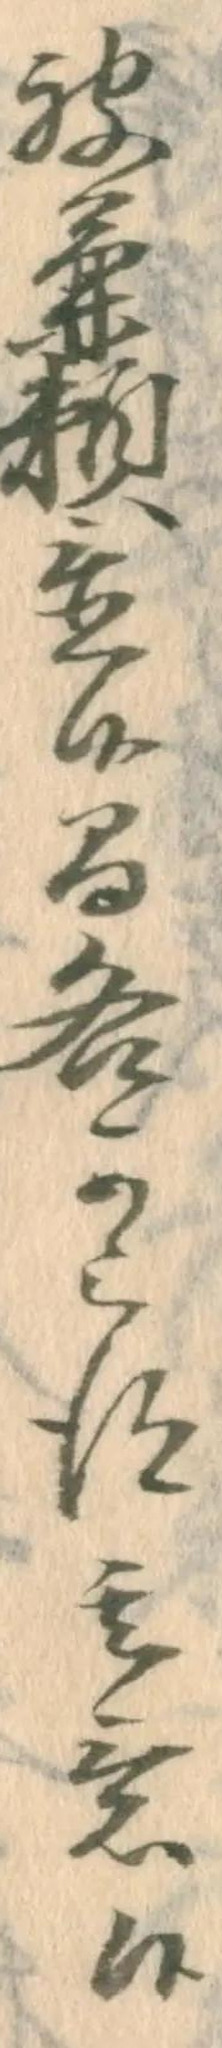被兼頼置候間各可被得其意候
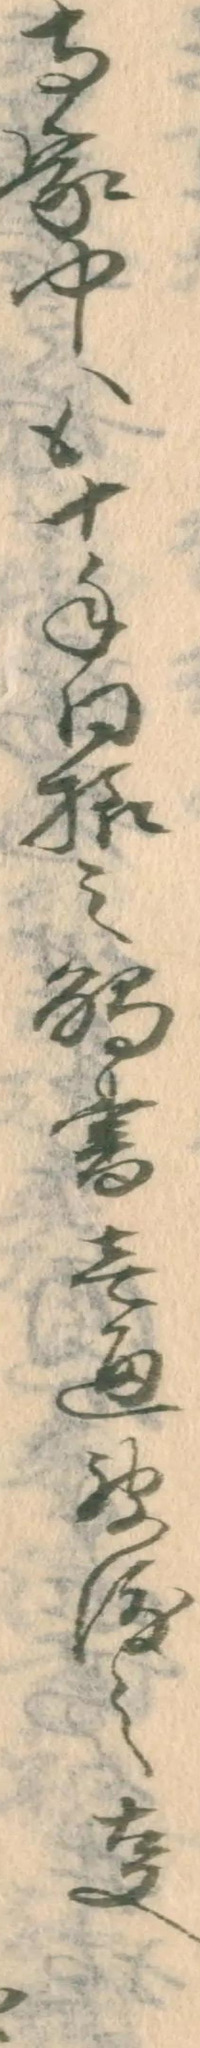寺家中へも十手同様之触書壱通被渡之事
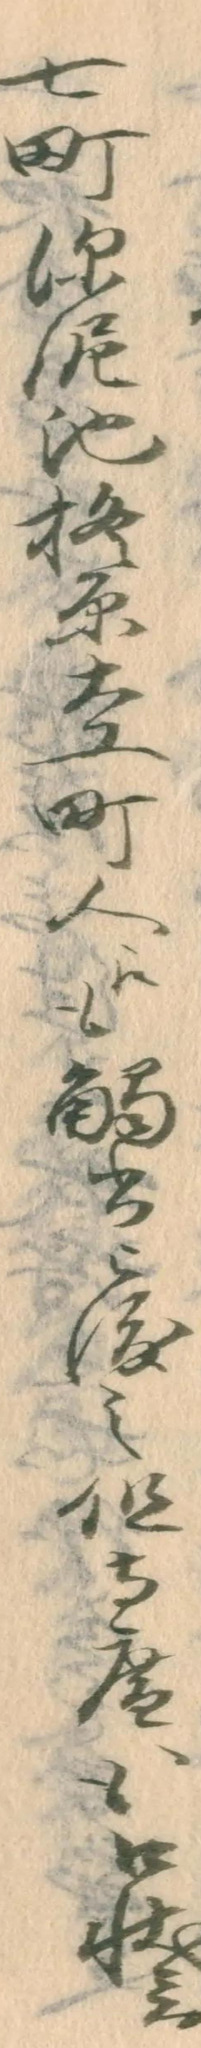一七町深泥池柊原大工町人江も触書被渡之但寺庵へも口状ニ而
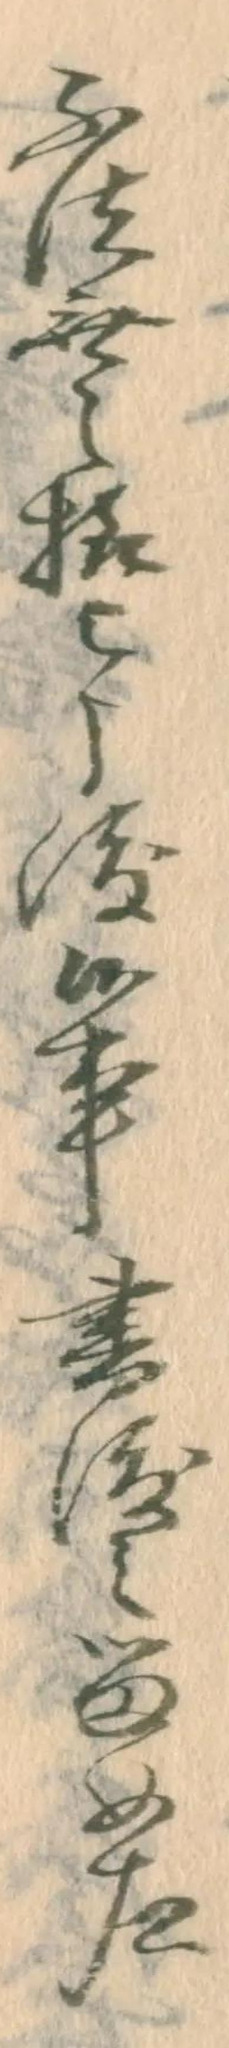不法無之様被申渡候事書渡之留如左
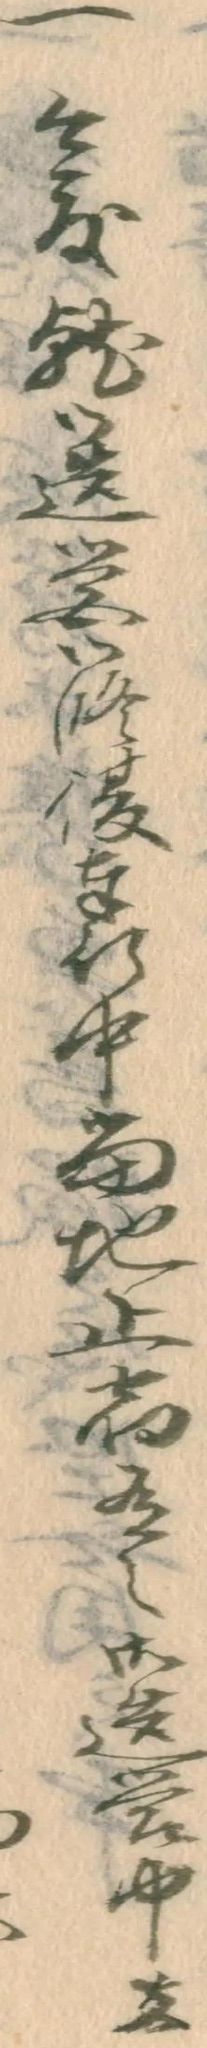一今度就御造営御修復奉行中当地止宿有之御造営中は
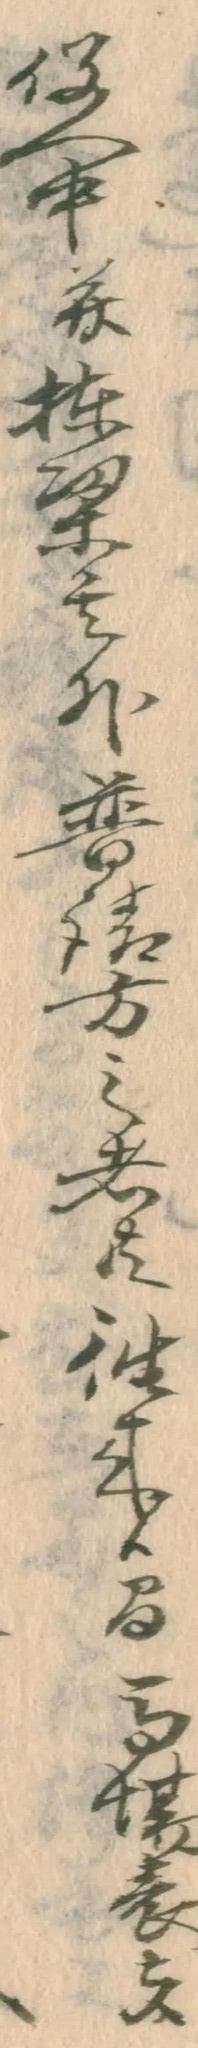役人中并棟梁其外普請方之者共往来候間馬場表は
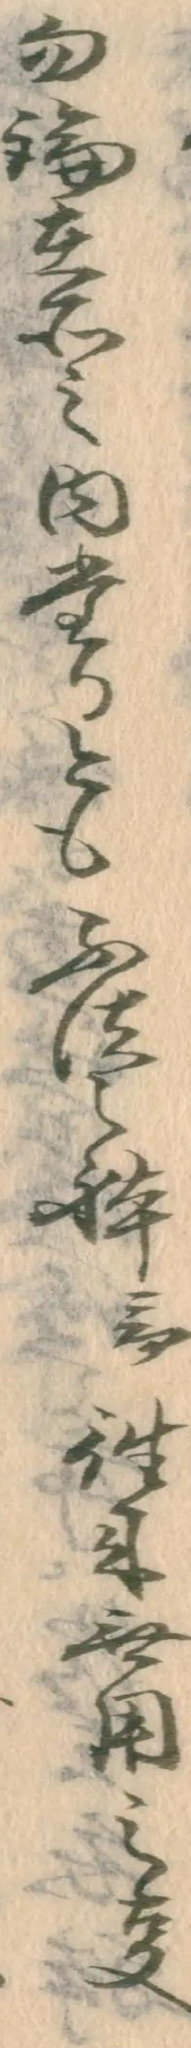勿論在所之内たりとも不法之体ニ而往来無用之事
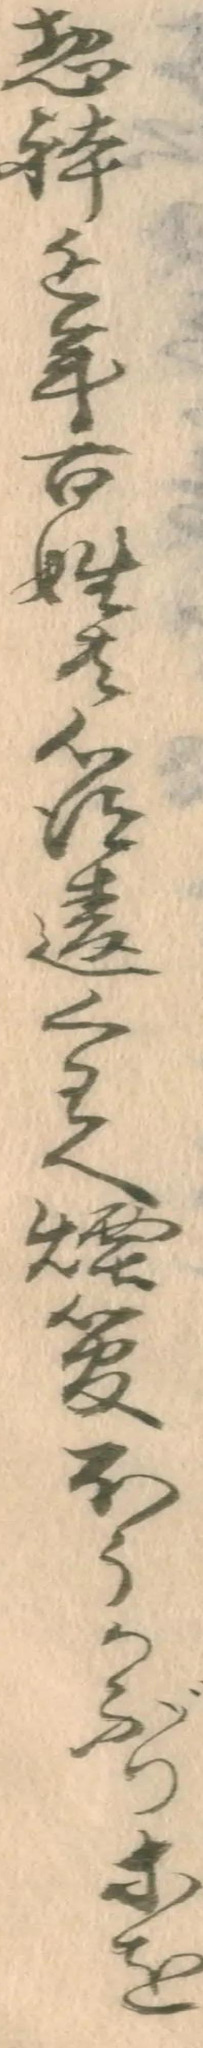惣体近年百姓共心得違くわへ煙管ほうかぶり等を
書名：賀茂社記録. 第17冊
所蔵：国立国会図書館 National Diet Library, JAPAN
